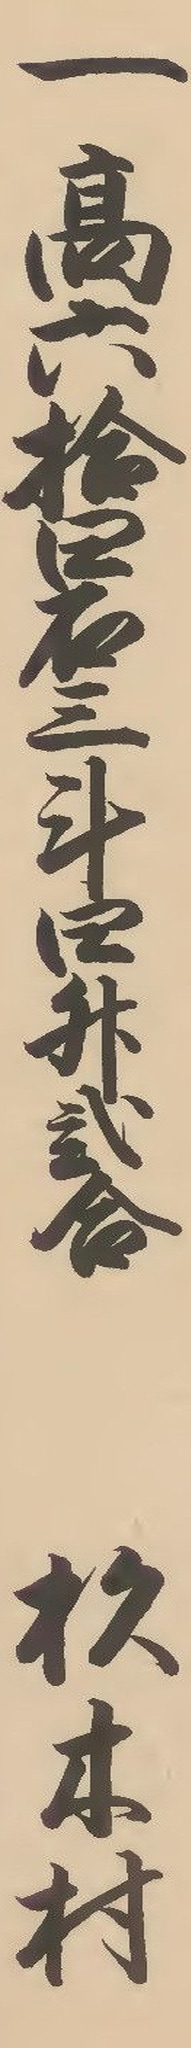一高六拾四石三斗四升弐合杉木村
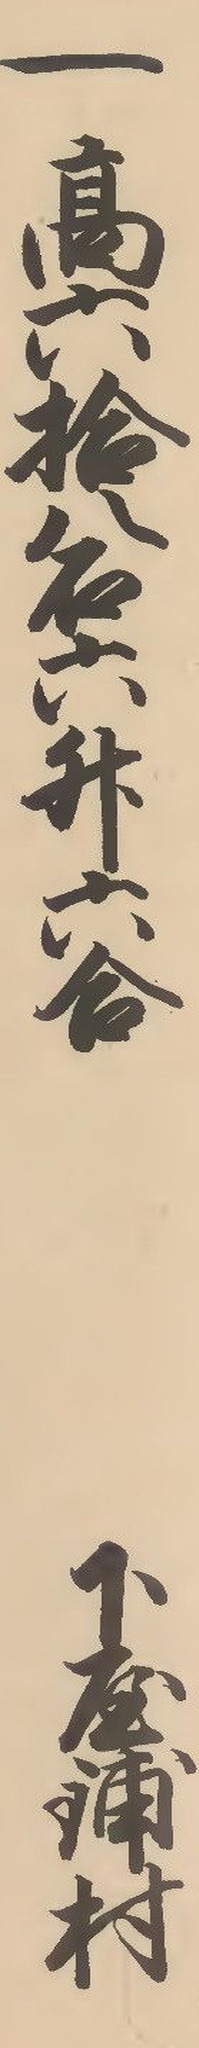一高六拾八石六升六合下屋鋪村
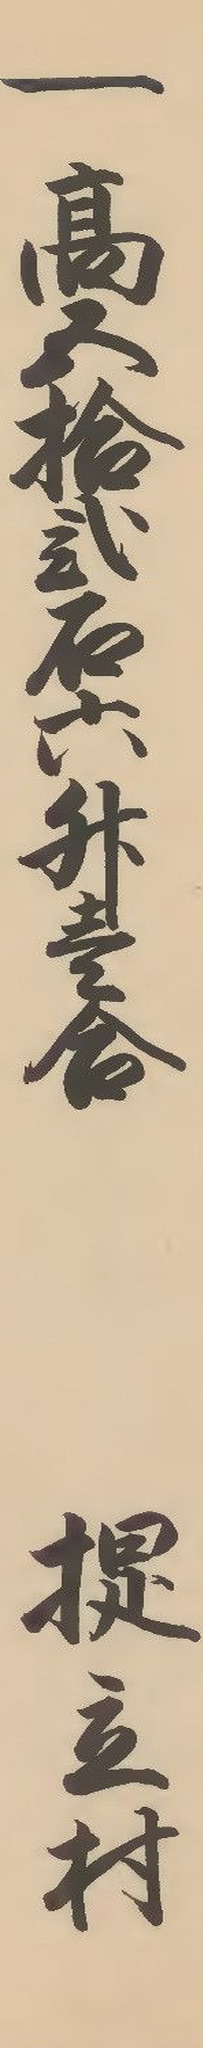一高五拾弐石六升壱合提立村
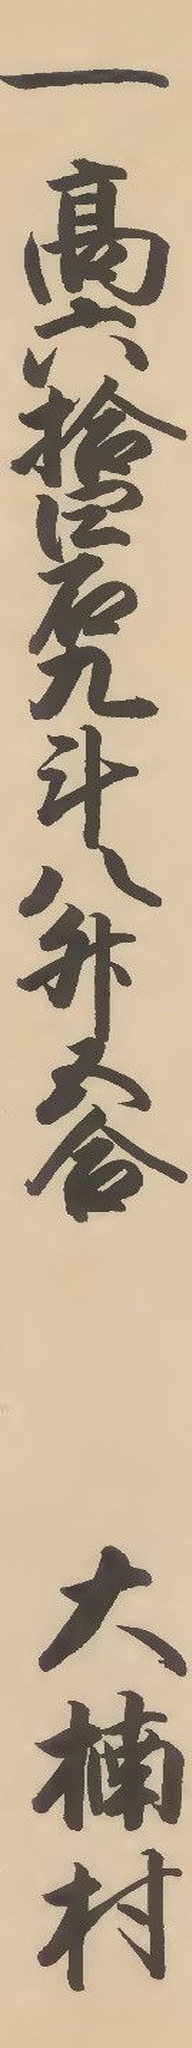一高六拾四石九斗八升五合大楠村
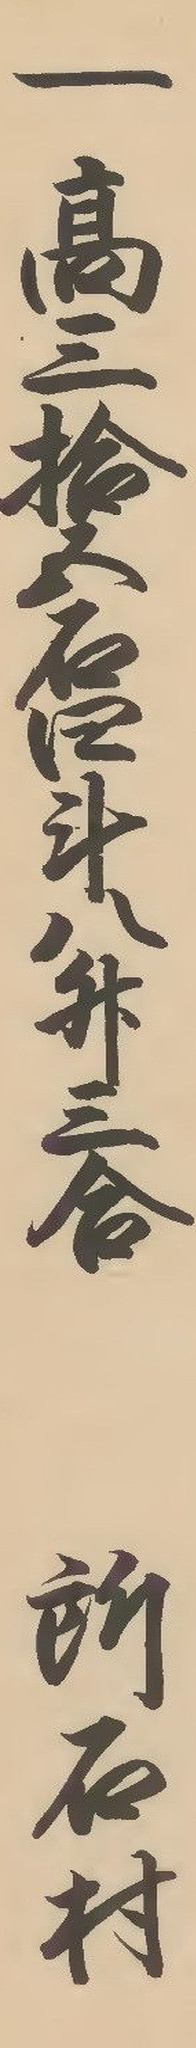一高三拾五石四斗八升三合所石村

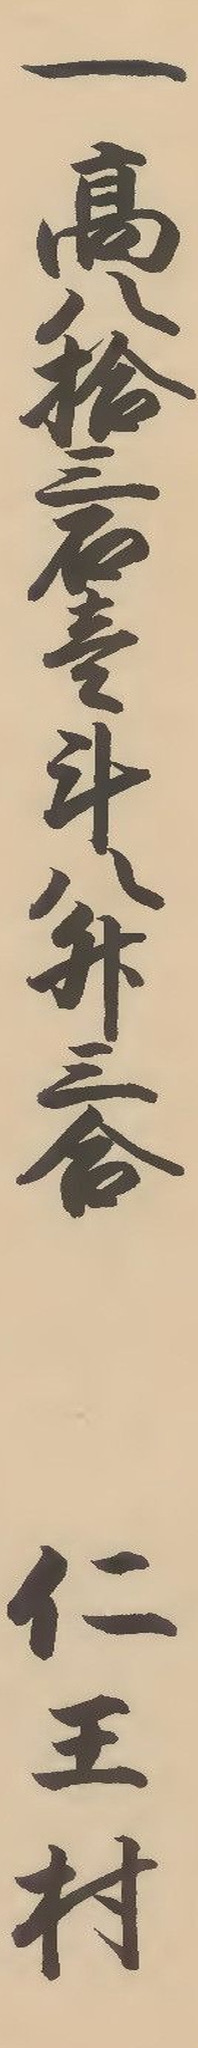一高八拾三石壱斗八升三合仁王村
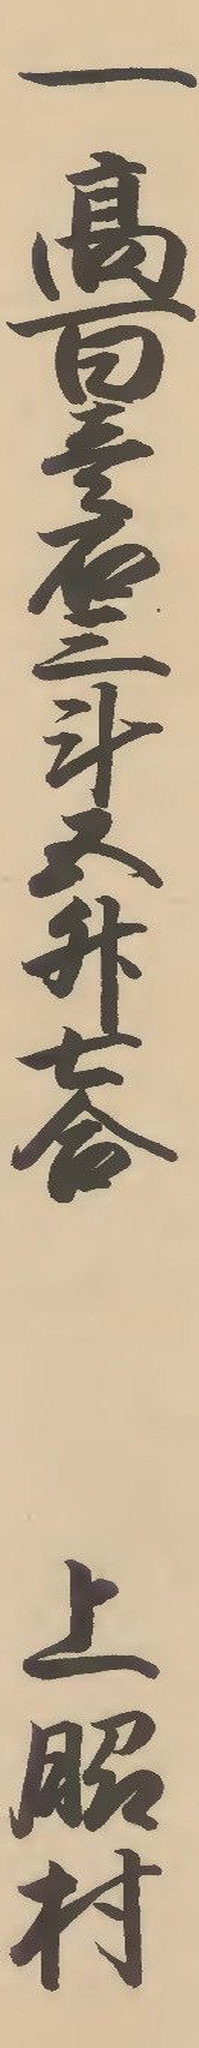一高百壱石三斗五升七合上脇村
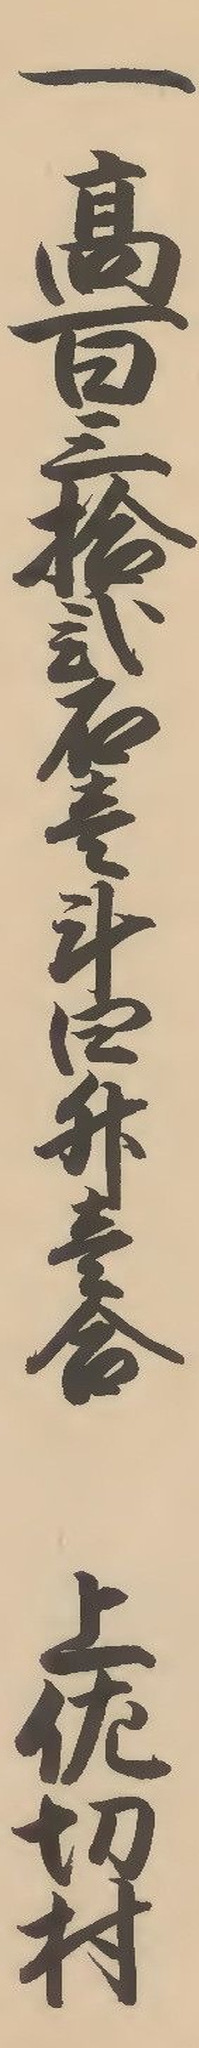一高百三拾弐石壱斗四升壱合上佐切村
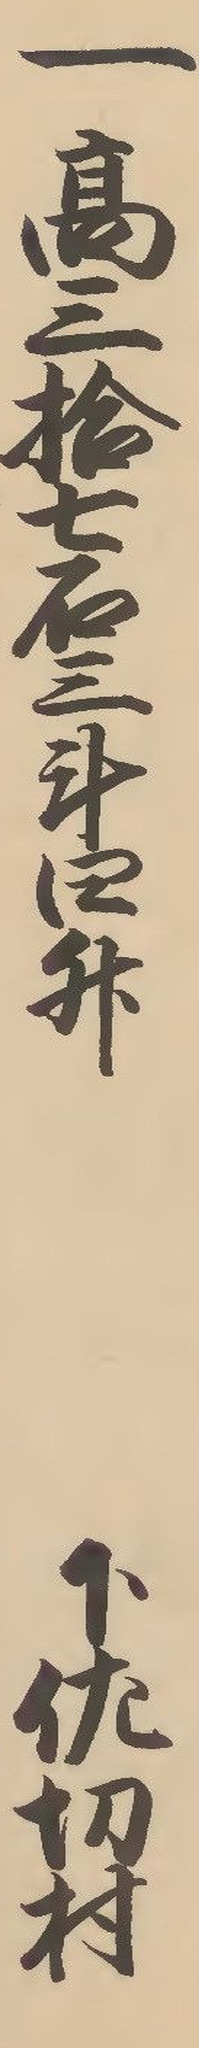一高三拾七石三斗四升下佐切村
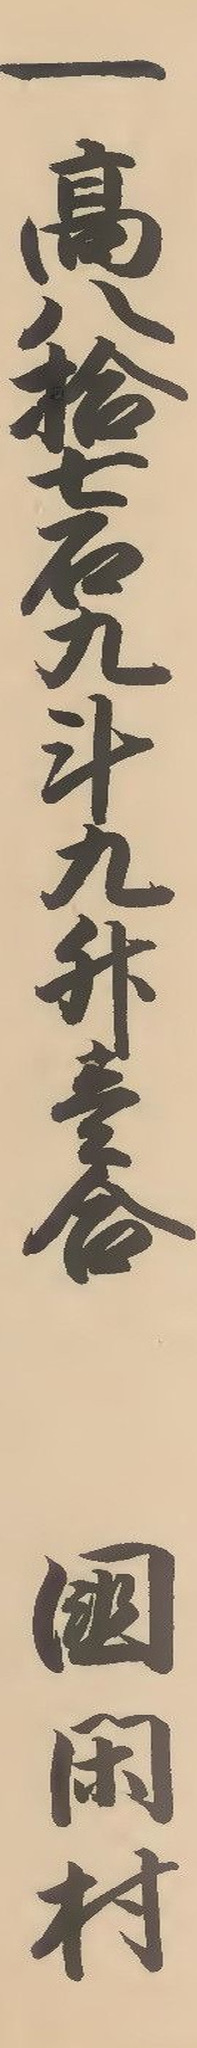一高八拾七石九斗九升壱合国閑村
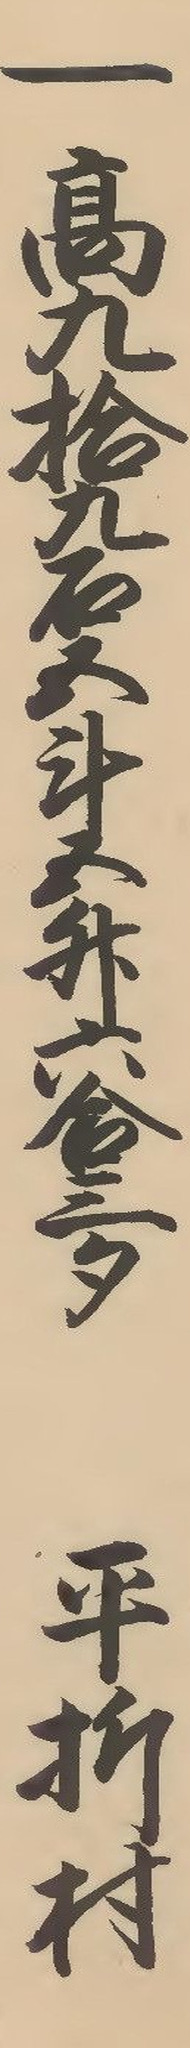一高九拾九石五斗五升六合三勺平折村
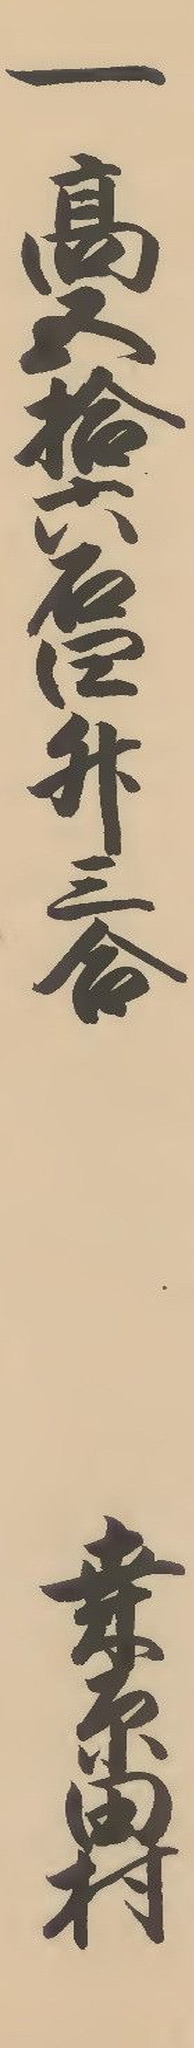一高五拾六石四升三合桑原田村
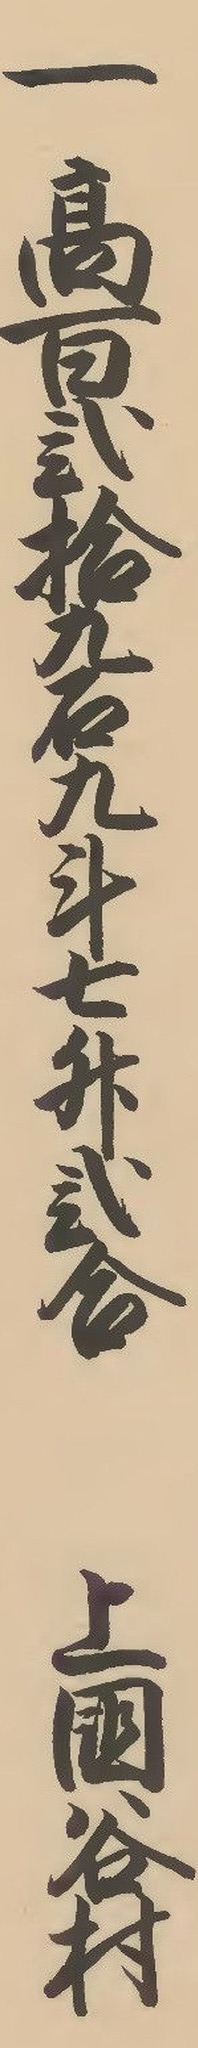一高百弐拾九石九斗七升弐合上国谷村

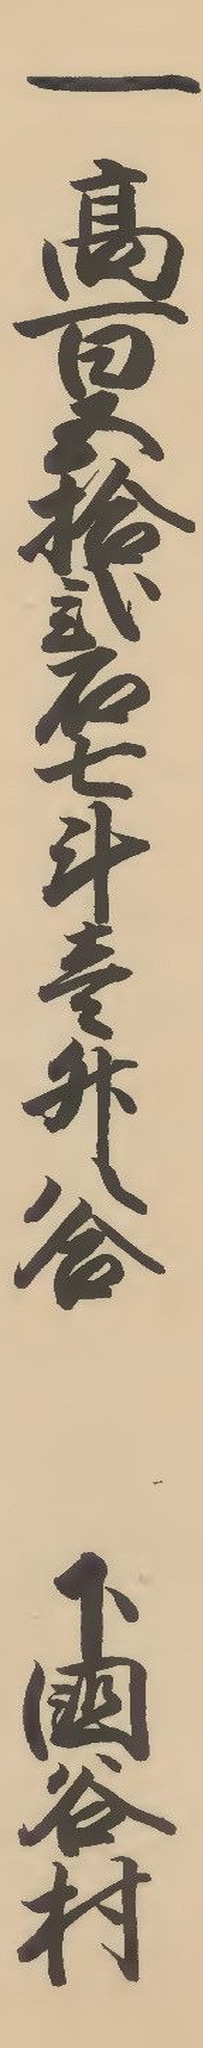一高百五拾弐石七斗壱升八合下国谷村
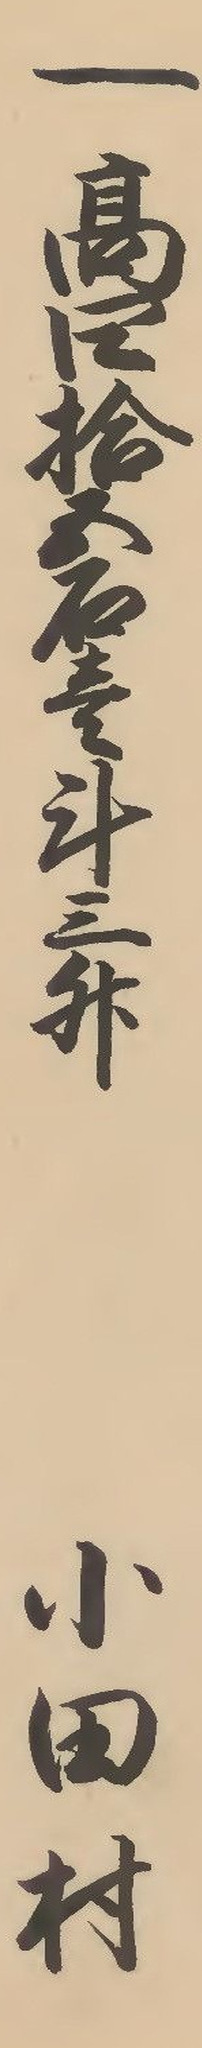一高四拾五石壱斗三升小田村
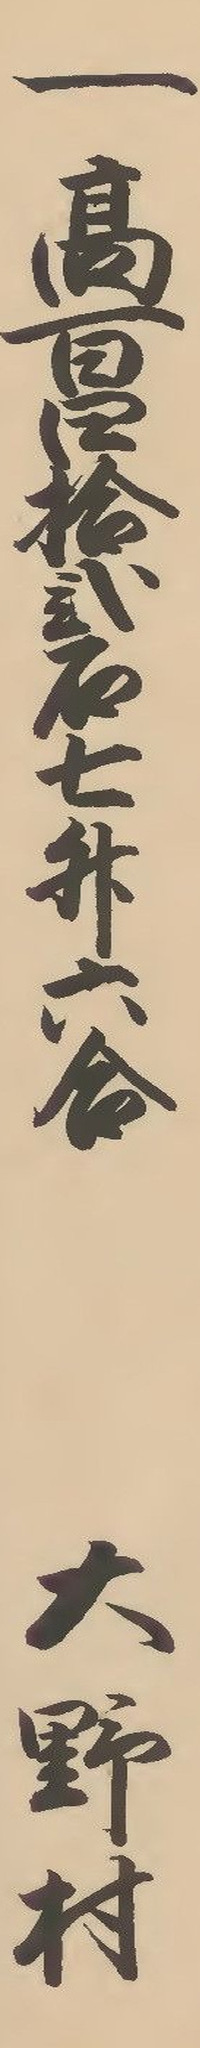一高百四拾弐石七升六合大野村
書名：三河国郷帳
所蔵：国立公文書館 National Archives of Japan
